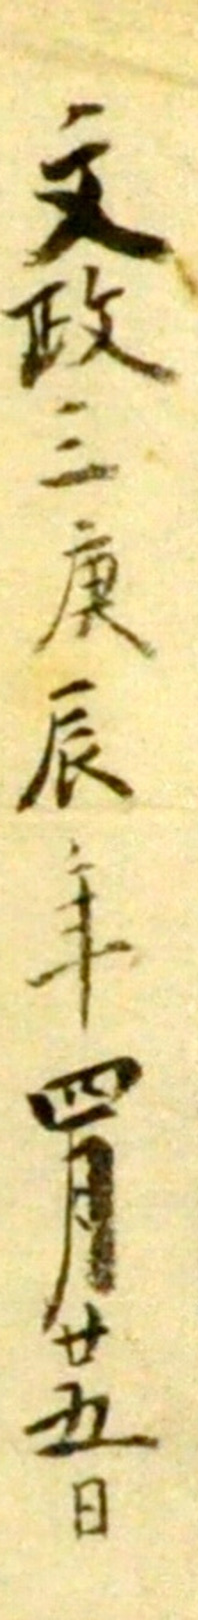文政三庚辰年四月廿五日
